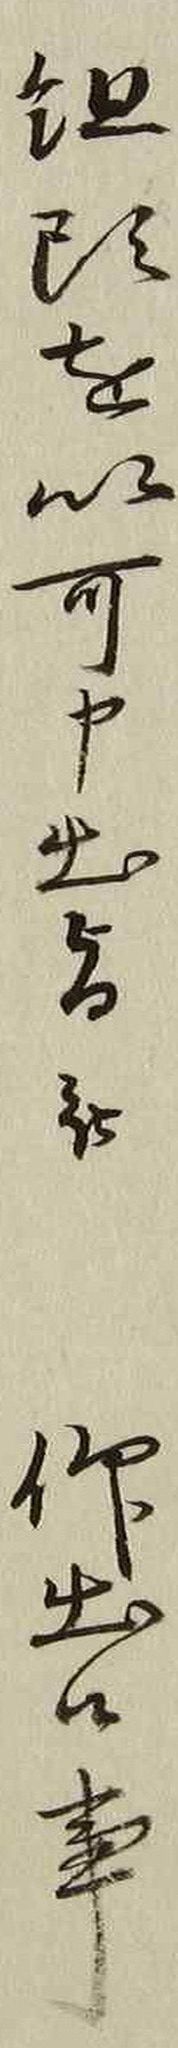組頭を以可申出旨被仰出候事
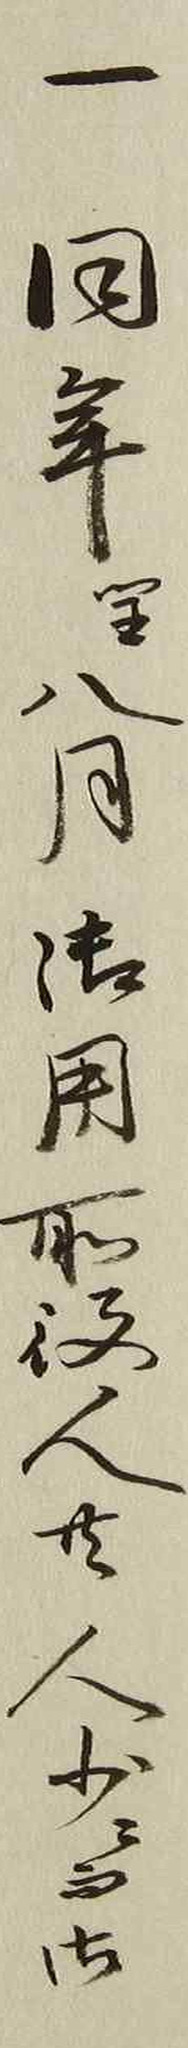一同年閏八月御用所役人共人少ニ而御
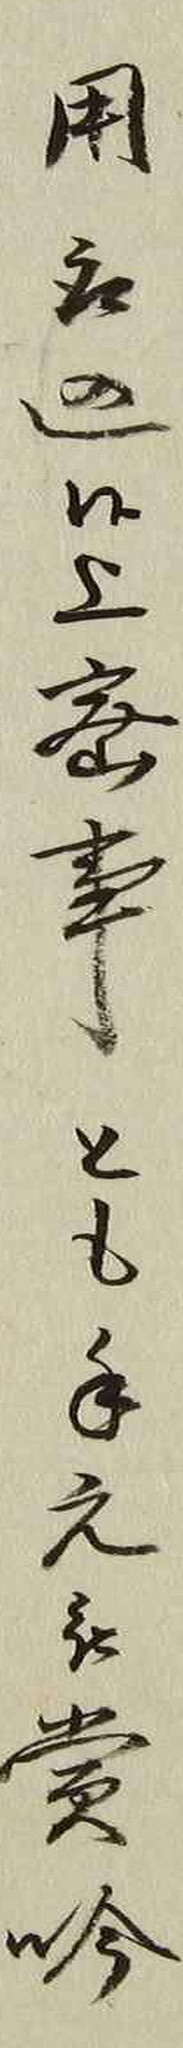用取込候上密事とも手元被賞吟
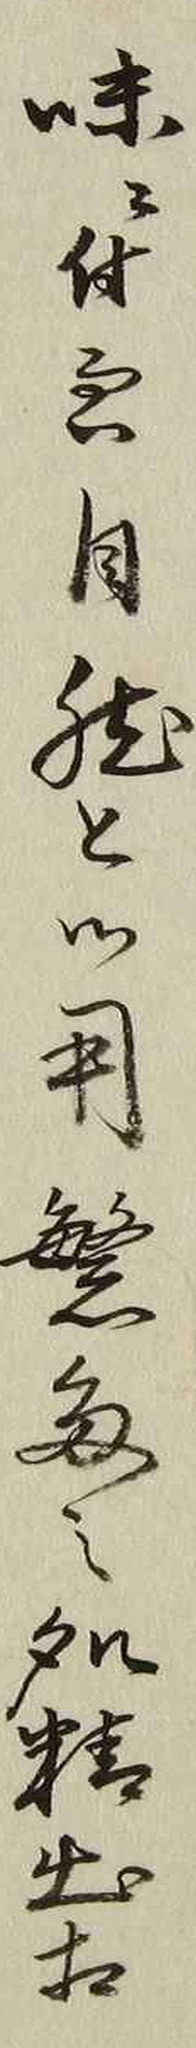味ニ付而ハ自然と御用繁多之処精出相
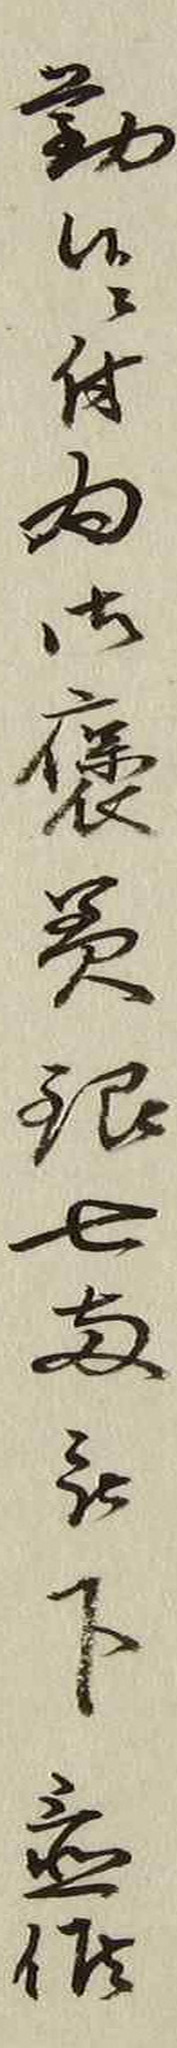勤候ニ付為御褒美銀七両被下置候
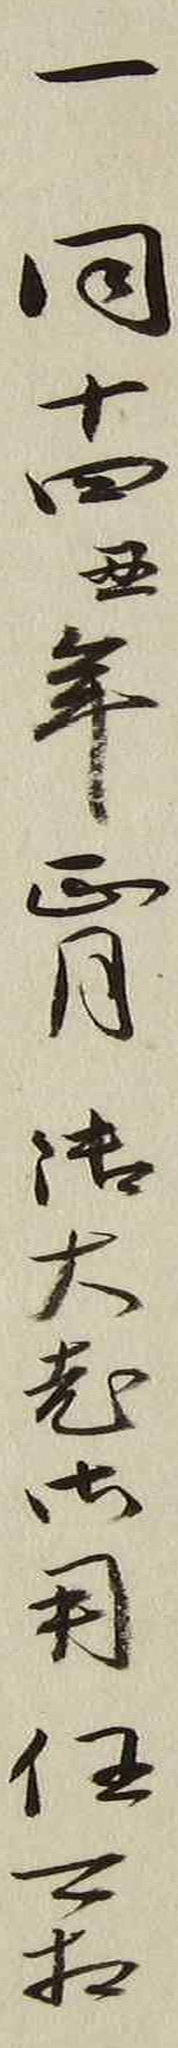一同十四丑年正月御大老御用任可相
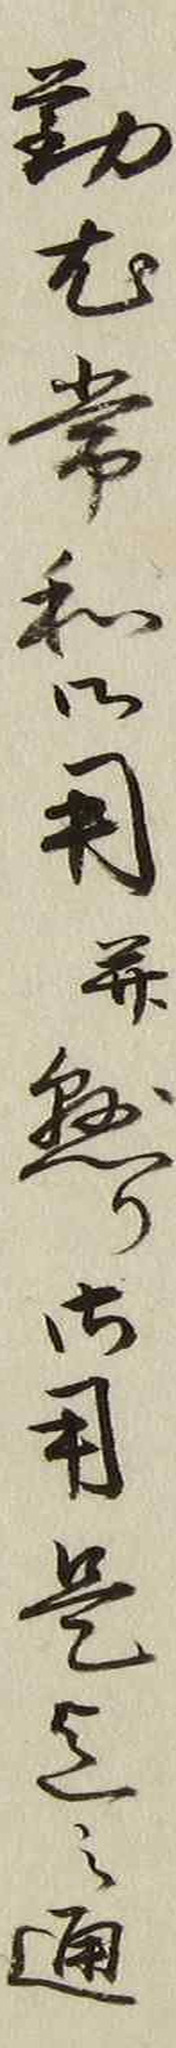勤尤常和御用并懸り御用是迄之通
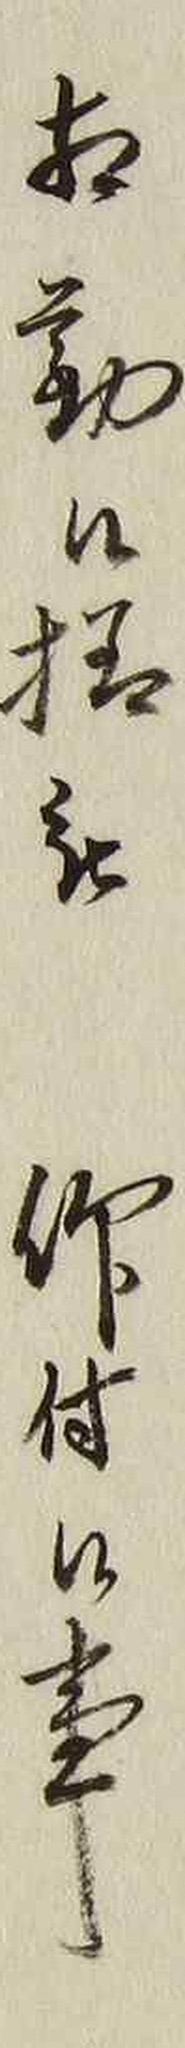相勤候様被仰付候事
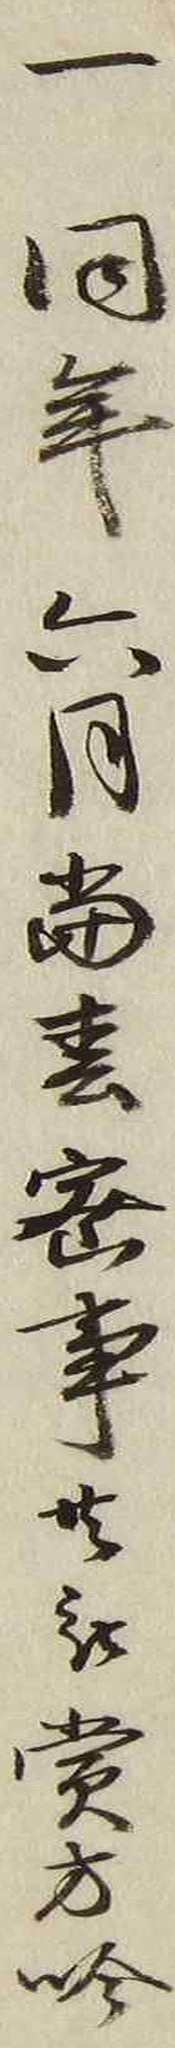一同年六月当春密事共被賞方吟
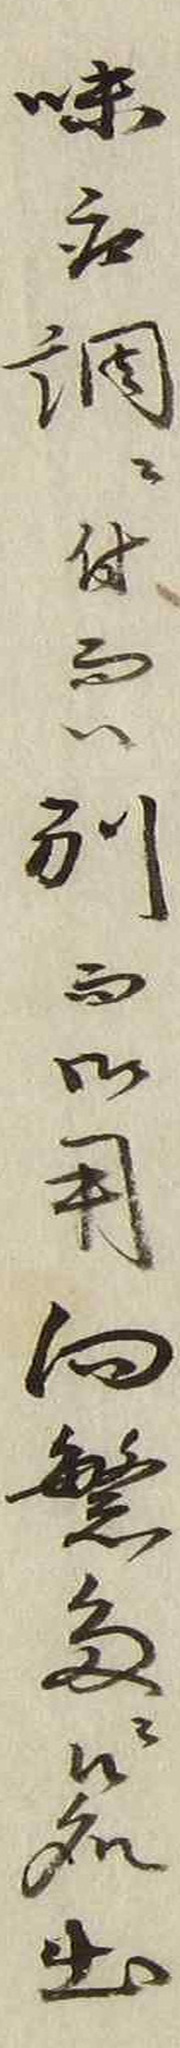味取調ニ付而ハ別而御用向繁多ニ候処出

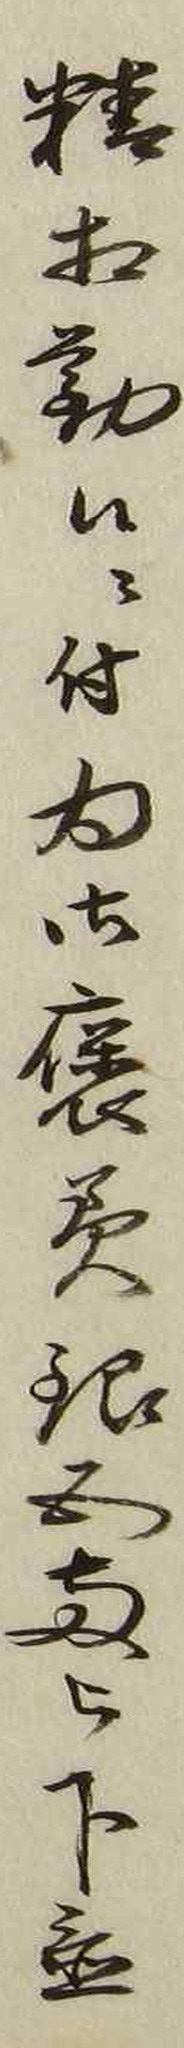精相勤候ニ付為御褒美銀五両被下置
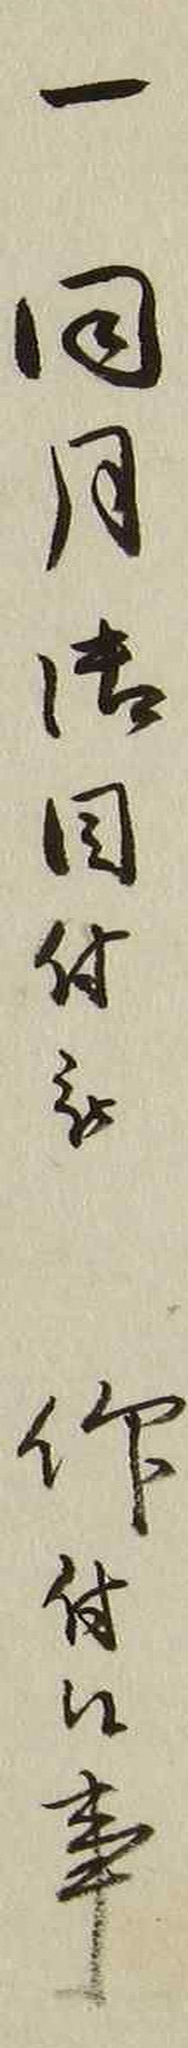一同月御目付被仰付候事
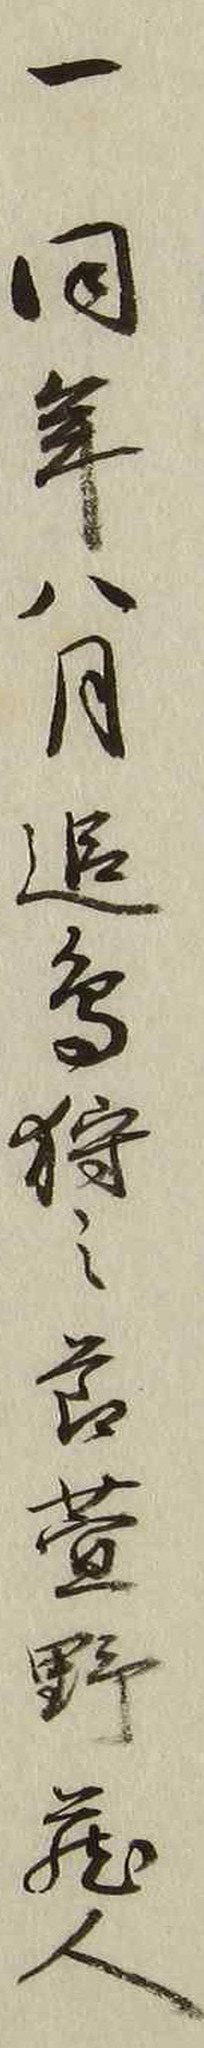一同年八月追鳥狩之節萱野蔵人
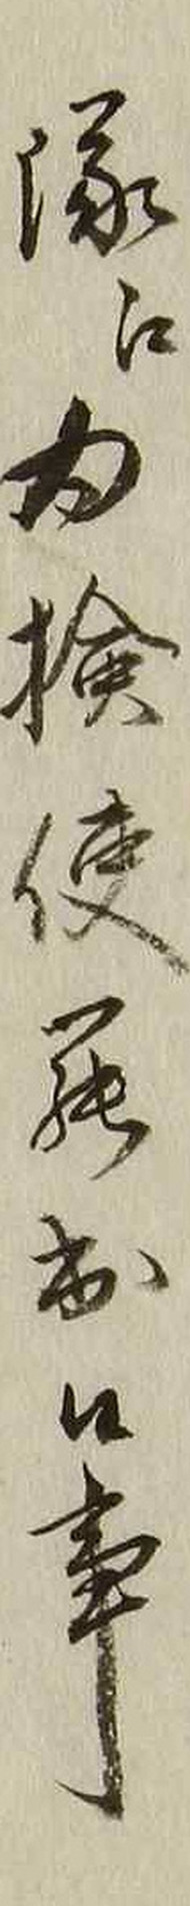隊江為検使罷出候事
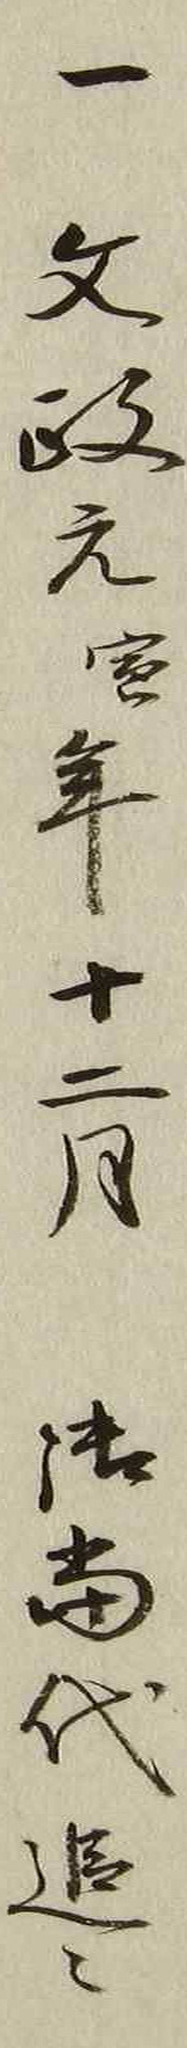一文政元寅年十二月御当代追々
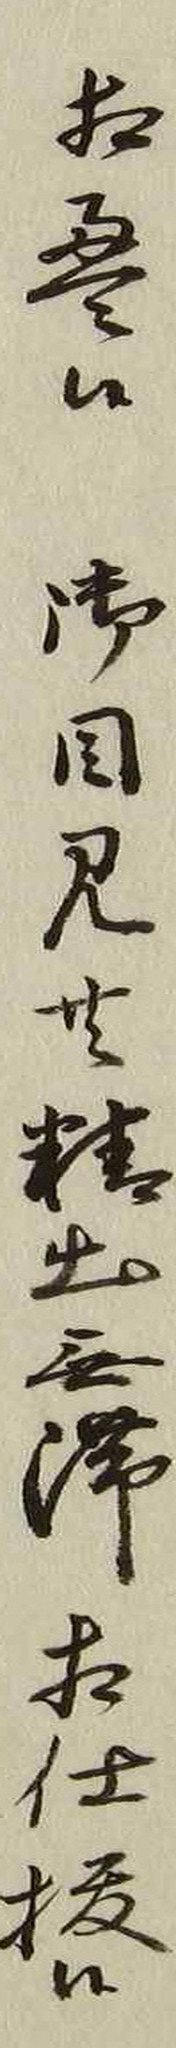相畳候御目見共精出無滞相仕抜候
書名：諸士系譜　巻之149　そ之部2
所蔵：会津若松市立会津図書館
